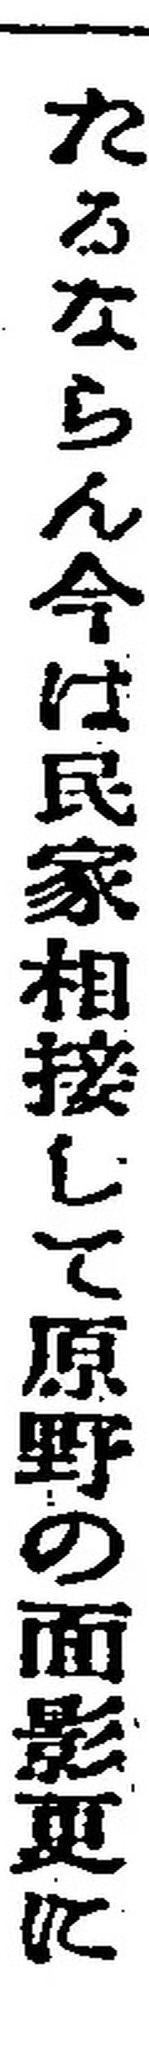たるならん今は民家相接して原野の面影更に
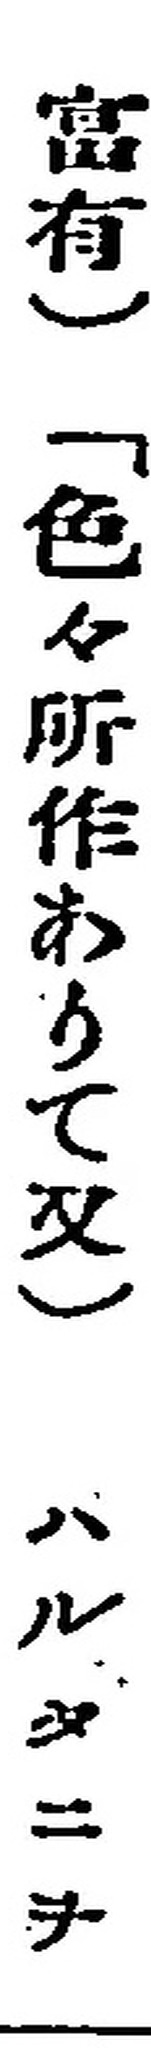富有)「色々所作ありて又)ハルタニヲ
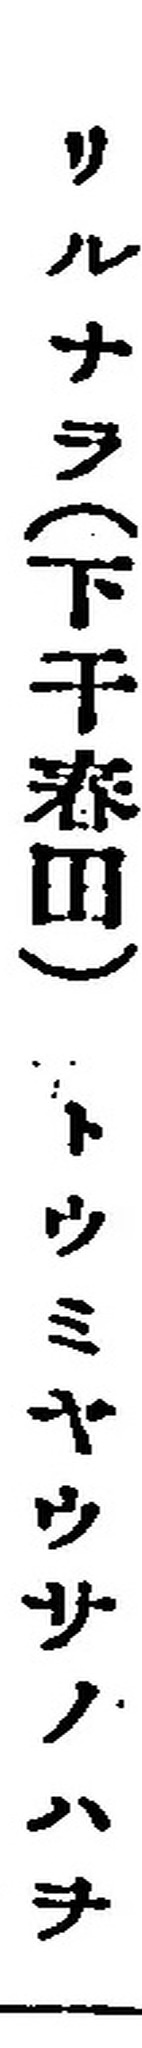リルナラ(下于春田)トウミヤウサノハヲ
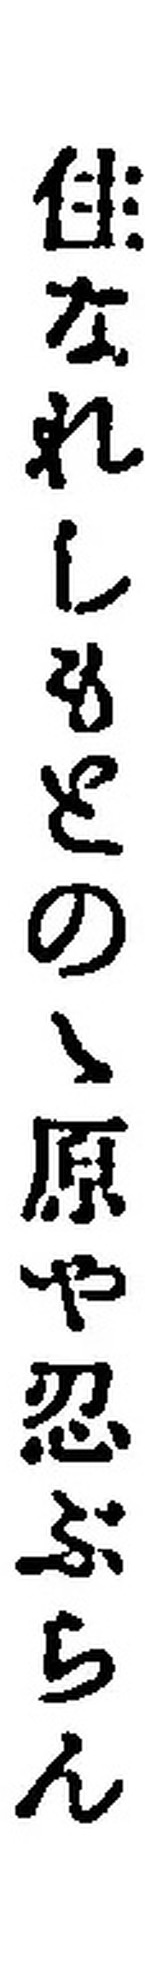住なれしもとのゝ原や忍ぶらん
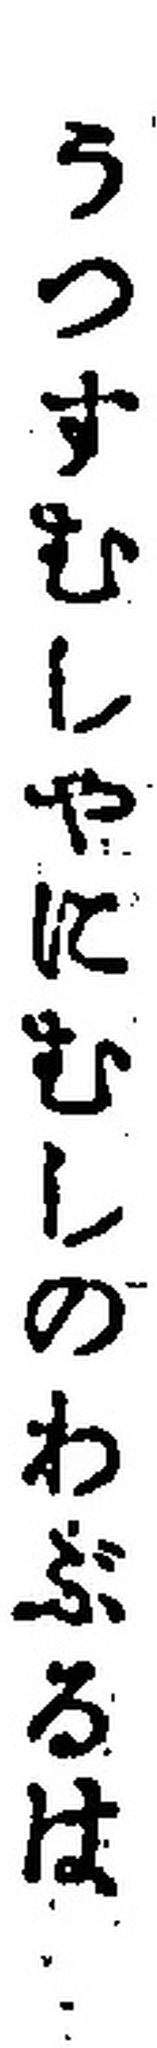うつすむしやにむしのわぶるは
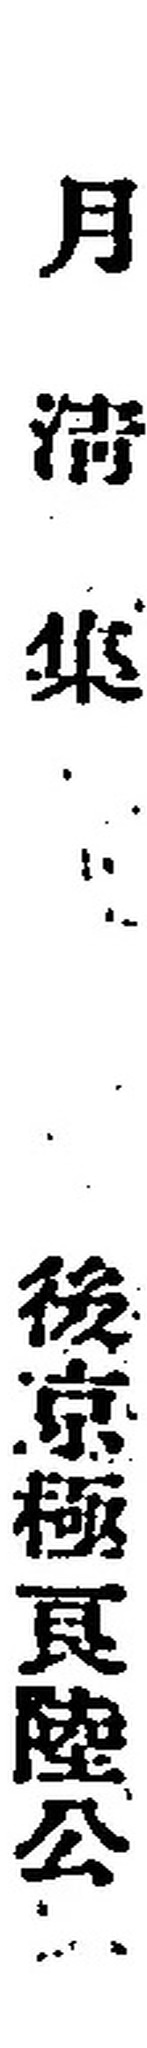月清集後京極良陸公
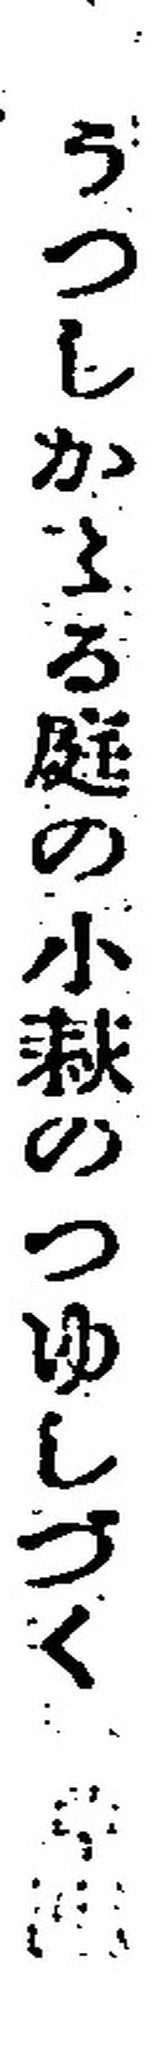うつしかゝる庭の小萩のつゆしづく
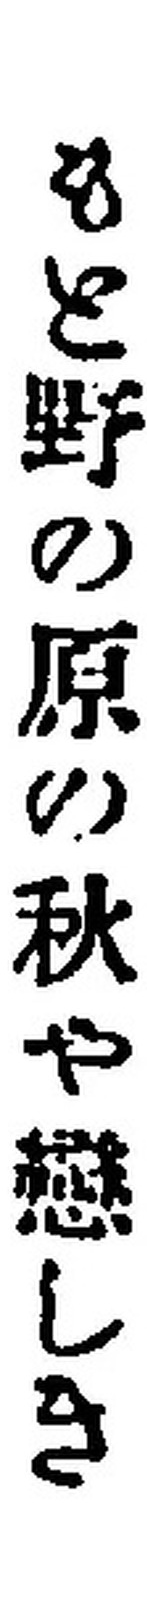もと野の原の秋や恋しき
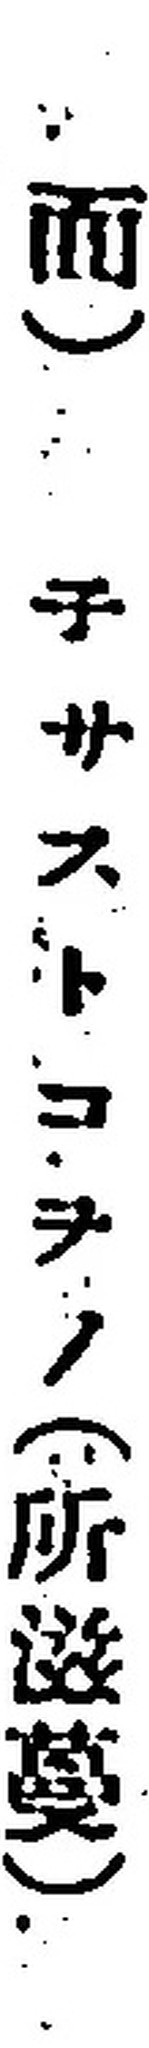面)ネサストコヲノ(所滋蔓)
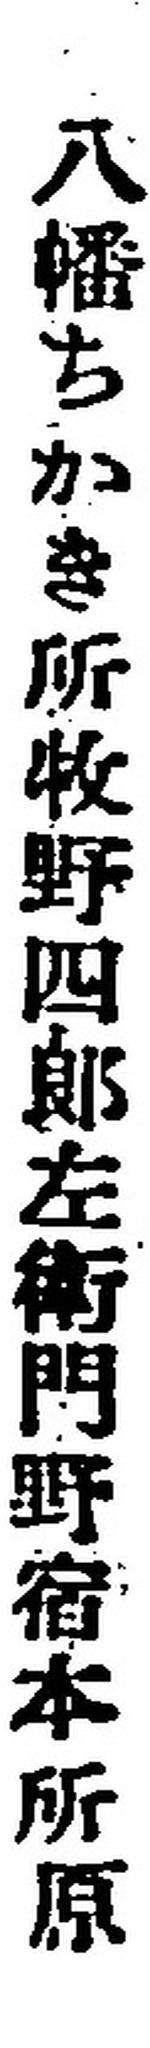八幡ちかき所牧野四郎左衛門野宿本所原
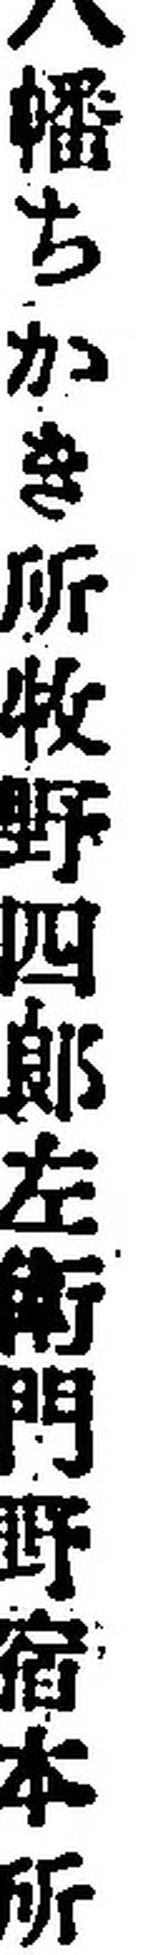八幡ちかき所牧野四郎左衛門野宿本所原
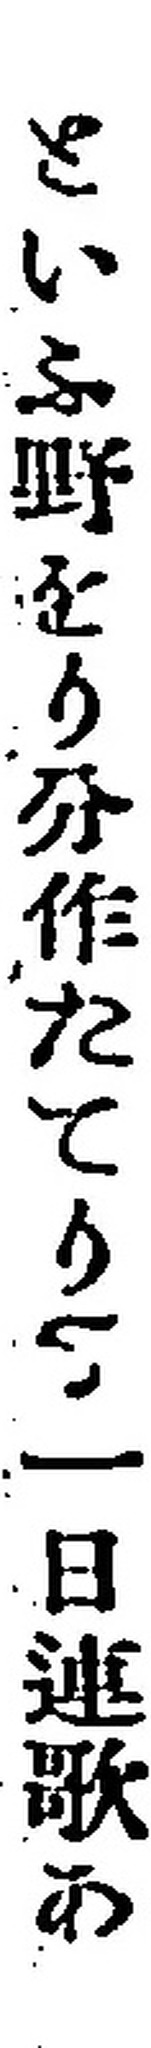といふ野をり分作たてりい一日連歌の
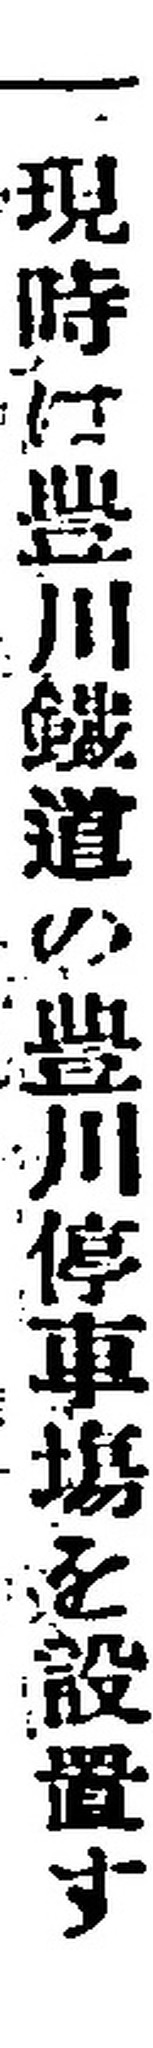現時は豊川鉄道の豊川停車場を設置す
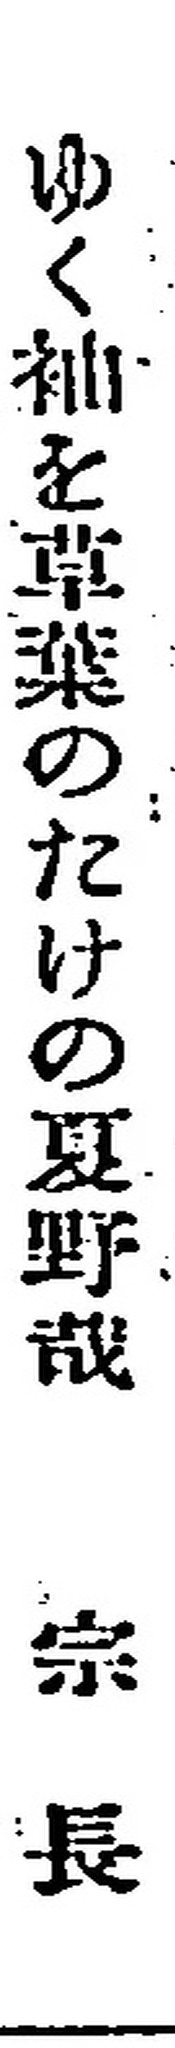ゆく袖を草葉のたけの夏野哉宗長
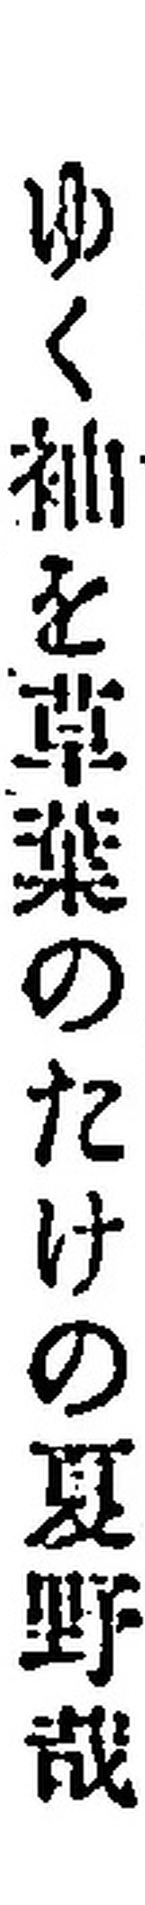ゆく袖を草葉のたけの夏野哉宗長
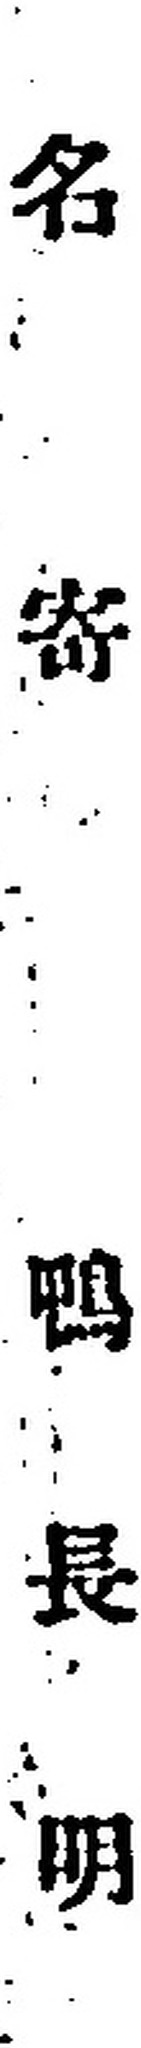名寄鴨長明
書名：東参名勝案内
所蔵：国立国会図書館 National Diet Library, JAPAN
